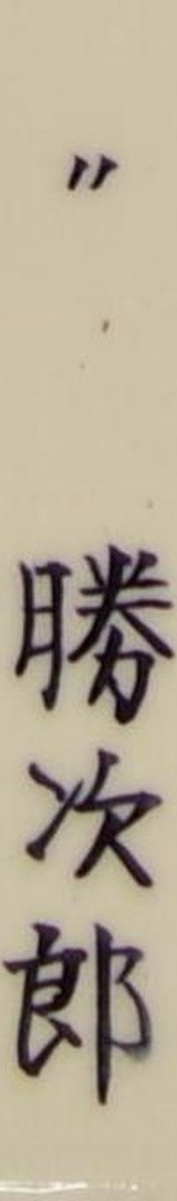勝次郎
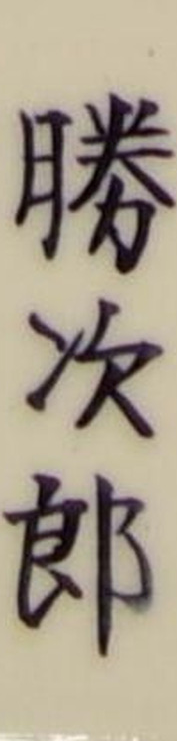勝次郎
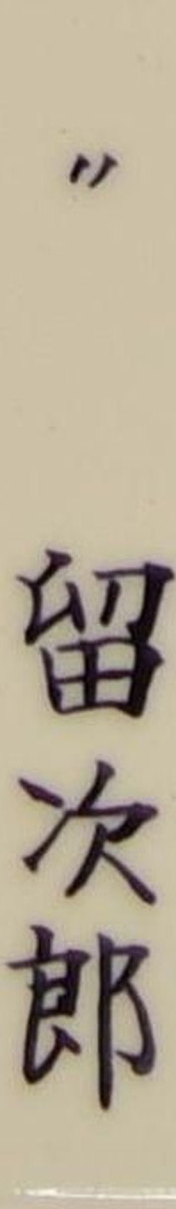留次郎
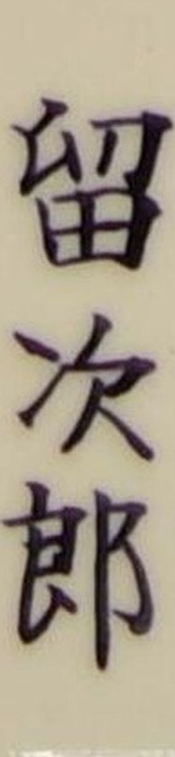留次郎
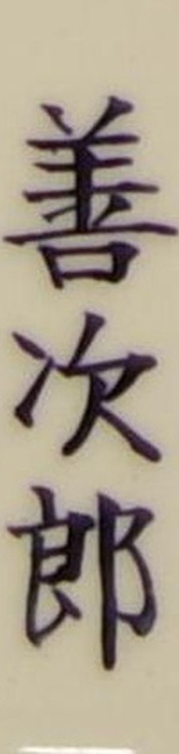善次郎
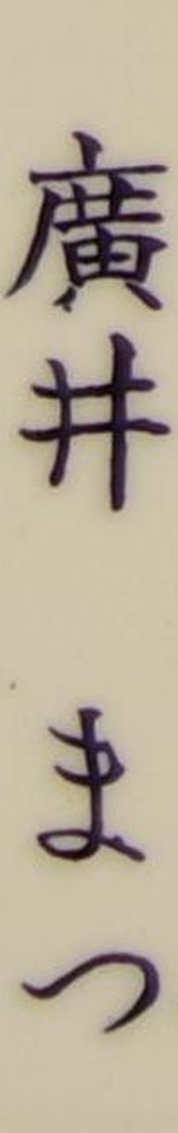廣井まつ
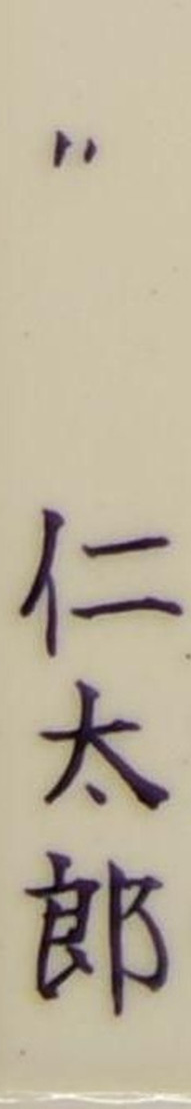仁太郎
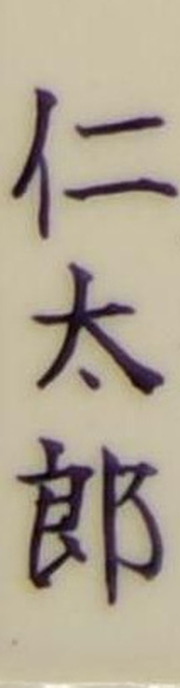仁太郎

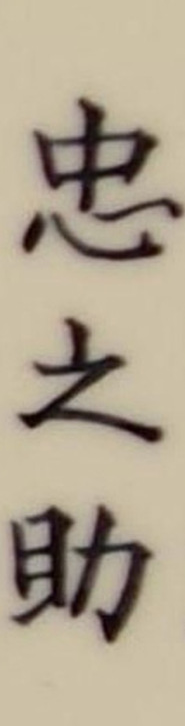忠之助
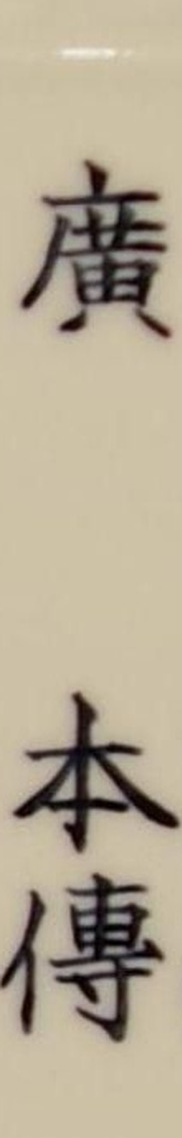廣本傳
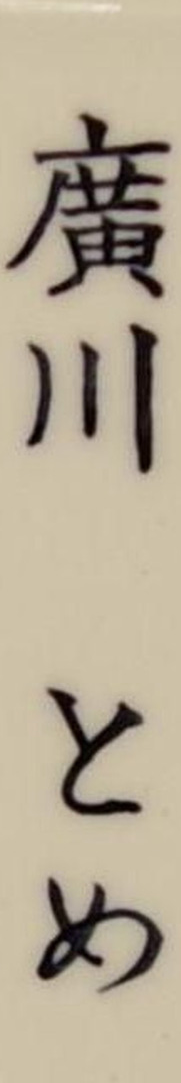廣川とめ
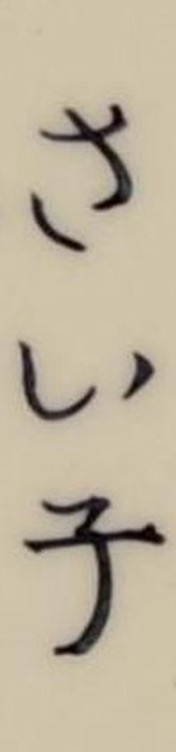さい子
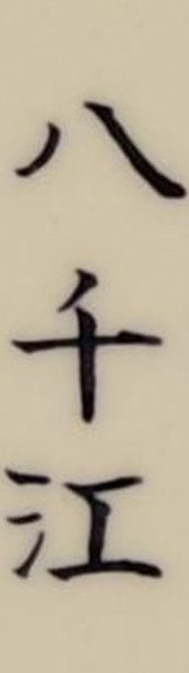八千江
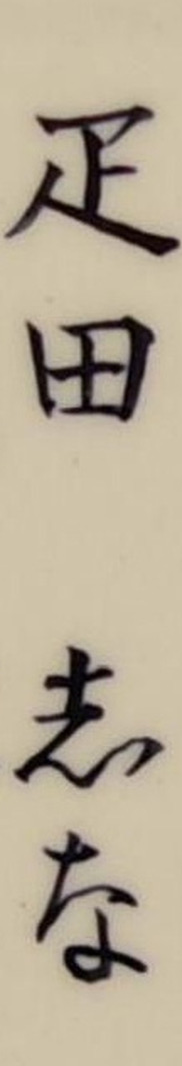疋田しな
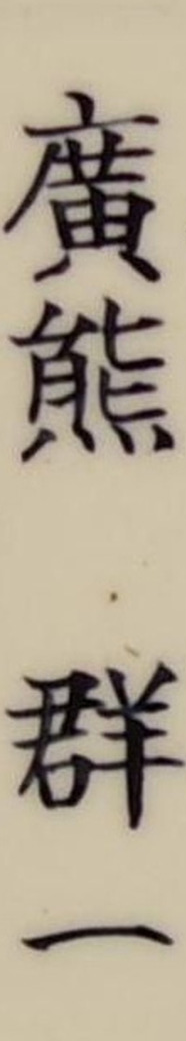廣熊群一
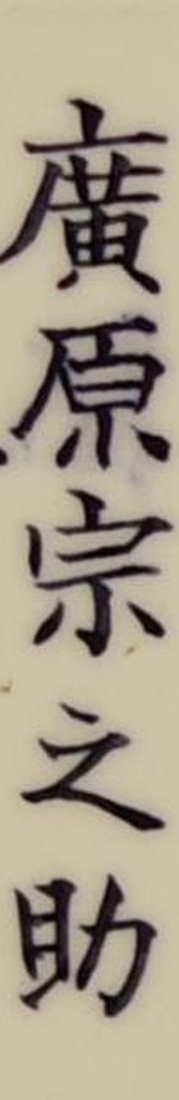廣原宗之助
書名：A~D
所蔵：koyasan kongobuji
